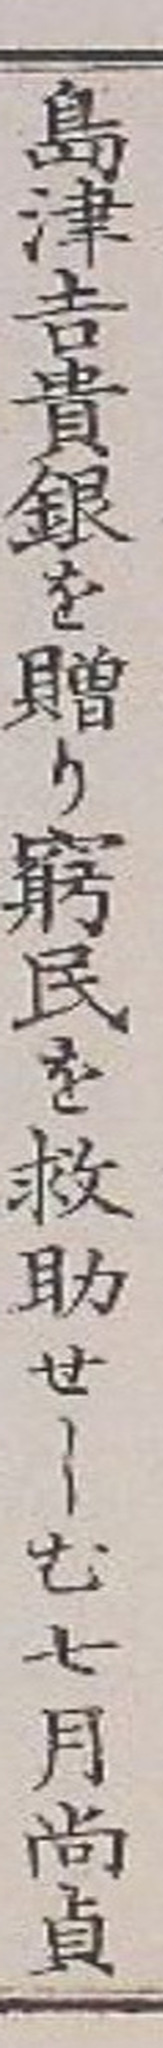島津吉貴銀を贈り窮民を救助せしむ七月尚貞
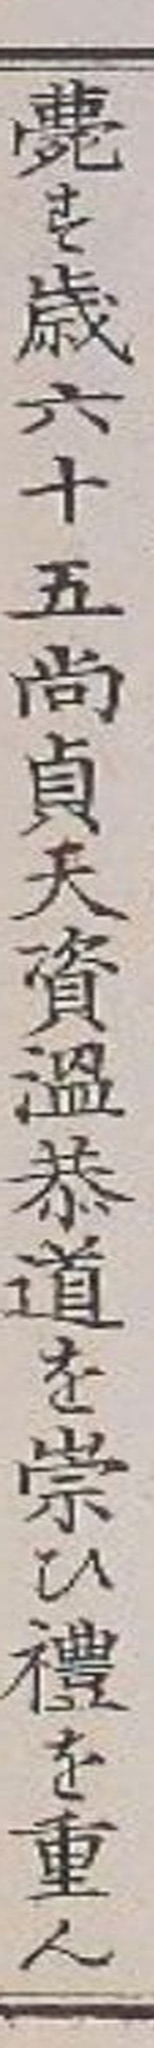薨す歳六十五尚貞天資温恭道を崇ひ礼を重ん
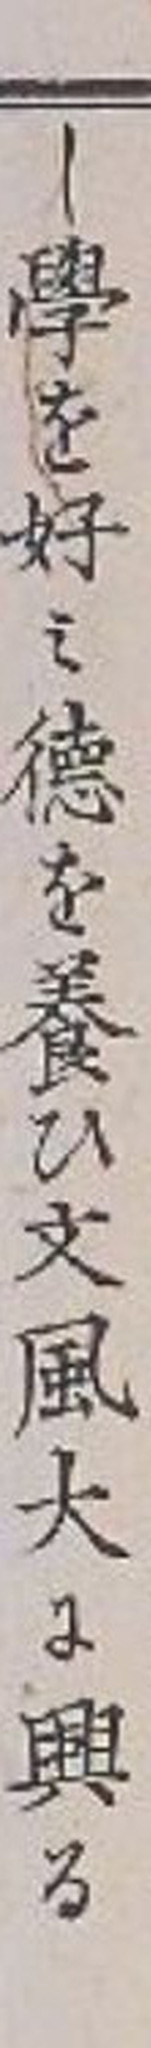し学を好み徳を養い文風大に興る
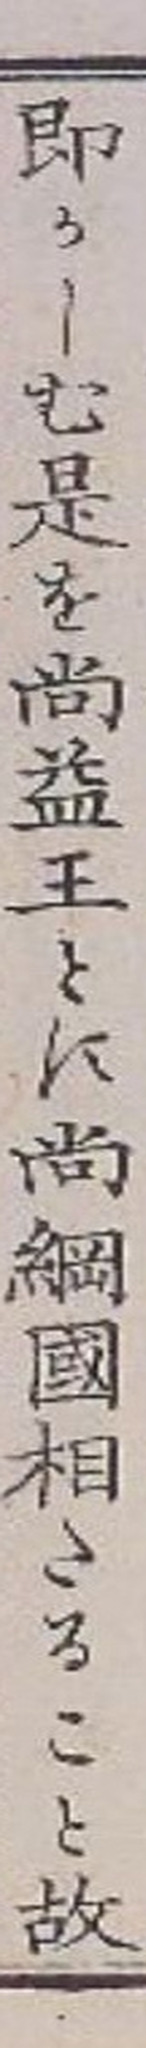即かしむ是を尚益王とす尚綱国相たること故

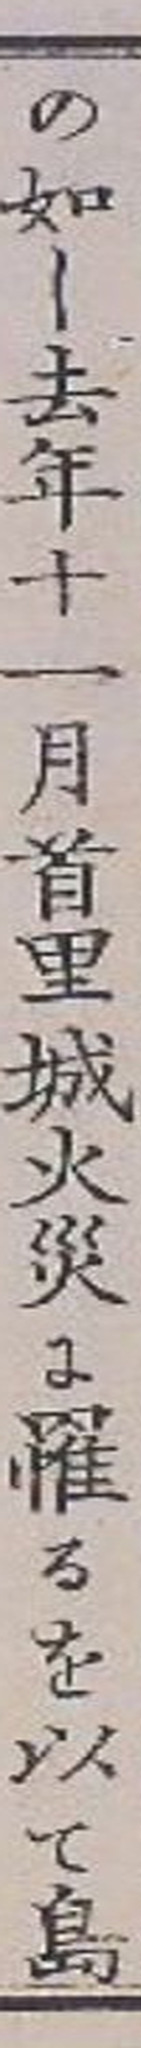の如し去年十一月首里城火災に罹るを以て島
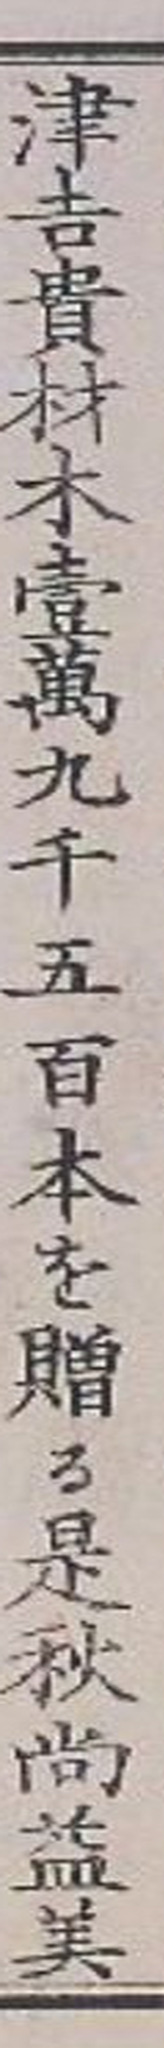津吉貴材木一万九千五百本を贈る是秋尚益美
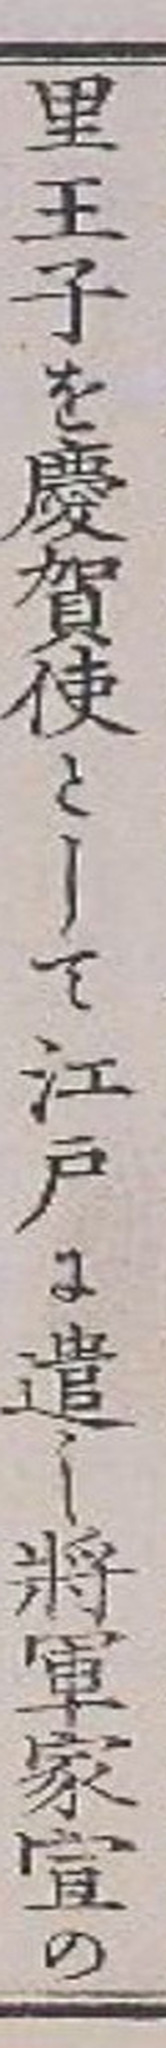里王子を慶賀使として江戸に遣し将軍家宣の
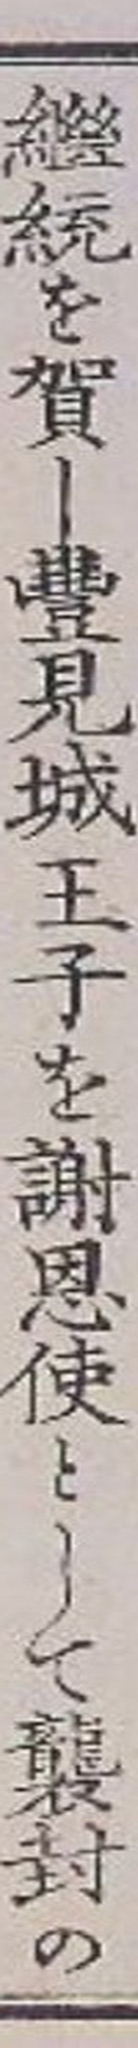継統を賀し豊見城王子を謝恩使として襲封の
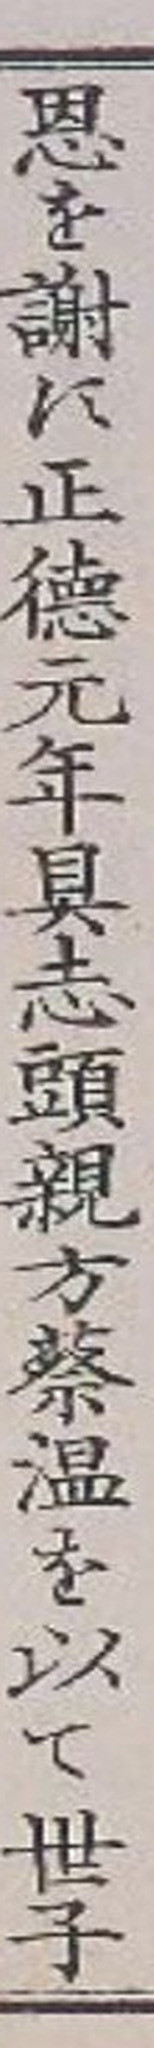恩を謝す正徳元年具志頭親方蔡温を以て世子
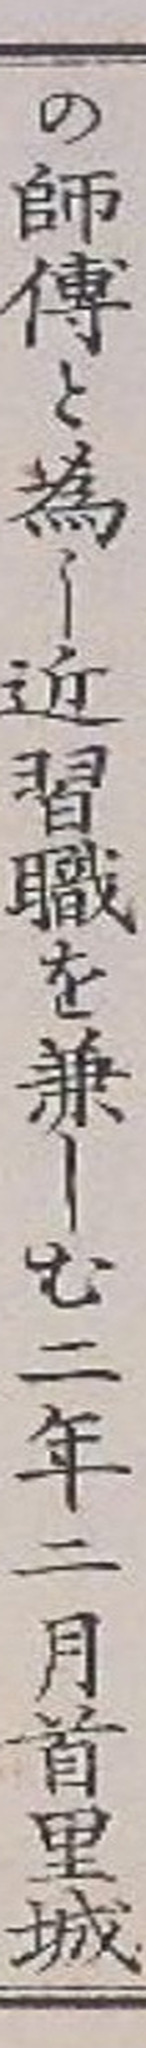の師伝と為し近習職を兼しむ二年二月首里城
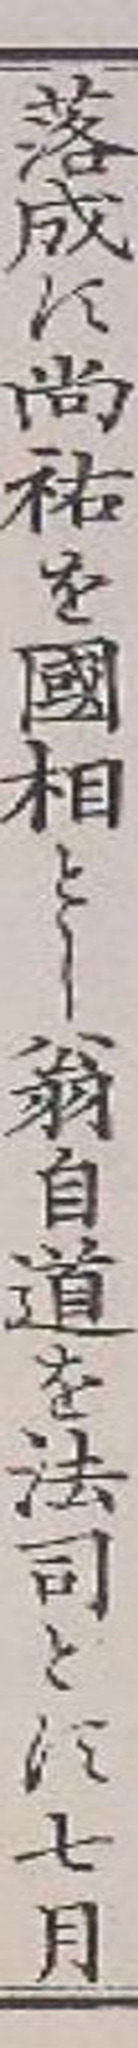落成す尚祐を国相とし翁自道を法司とす七月
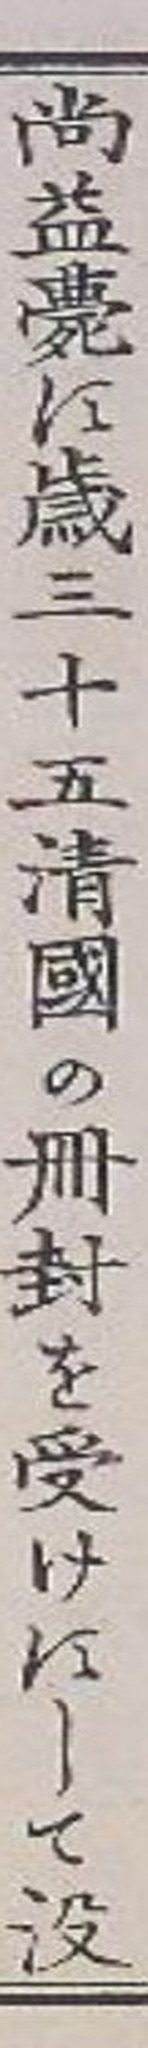尚益薨す歳三十五清国の冊封を受けすして没
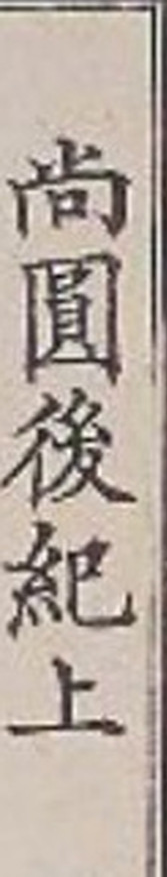尚円後紀上
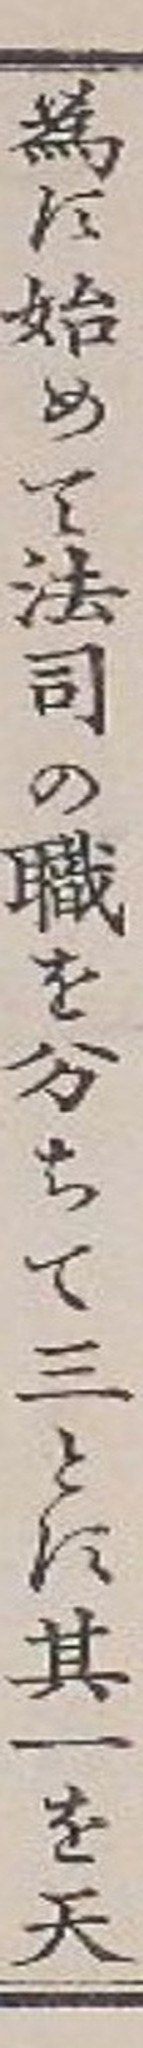為す始めて法司の職を分ちて三とす其一を天
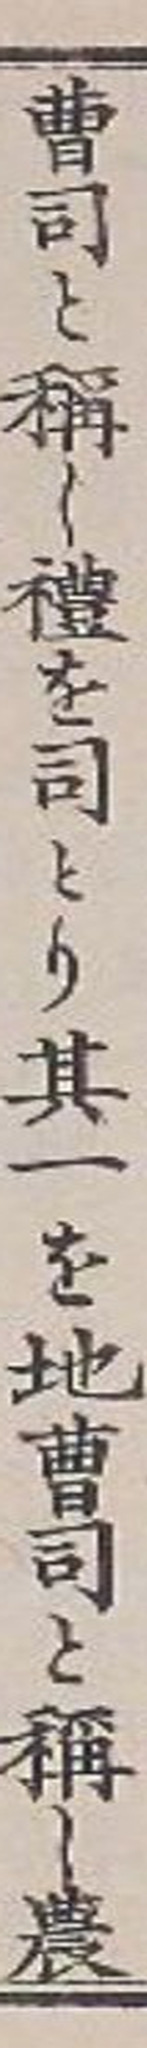曹司と称し礼を司とり其一を地曹司と称し農
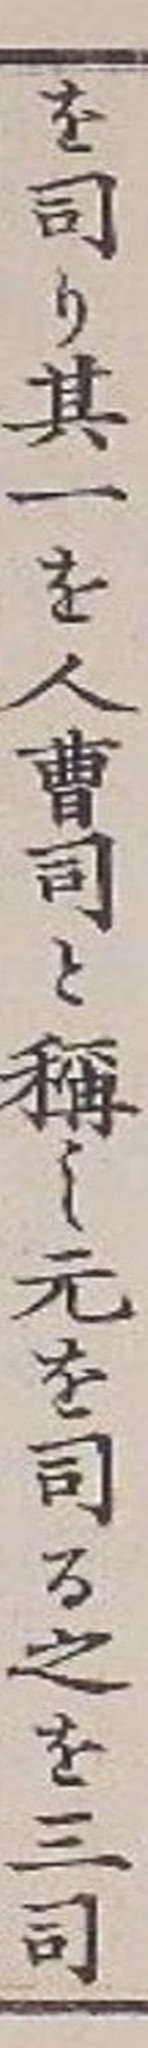を司り其一を人曹司と称し元を司る之を三司
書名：南島紀事 下
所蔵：University of the Ryukyus Library
